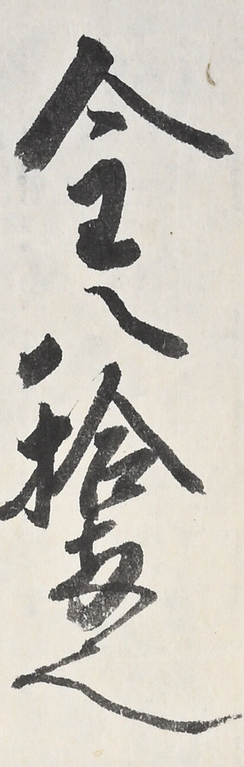金八拾両也
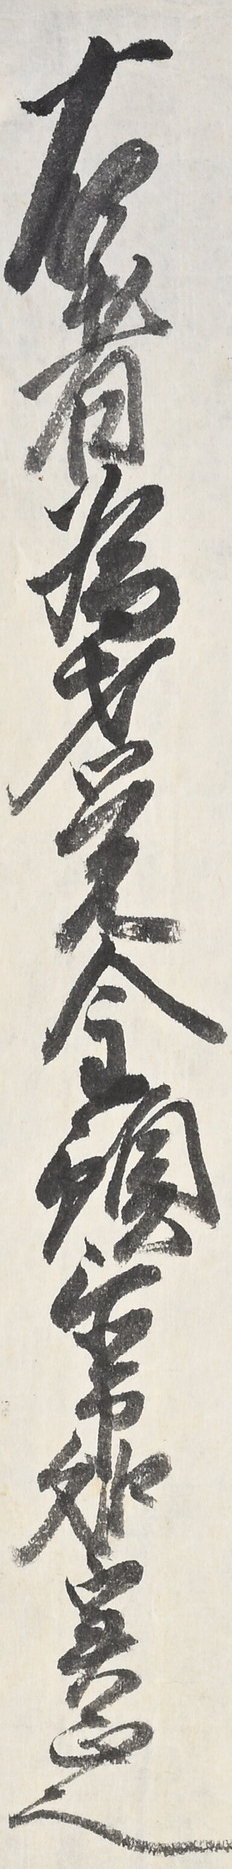右者為才覚金預置候処実正也
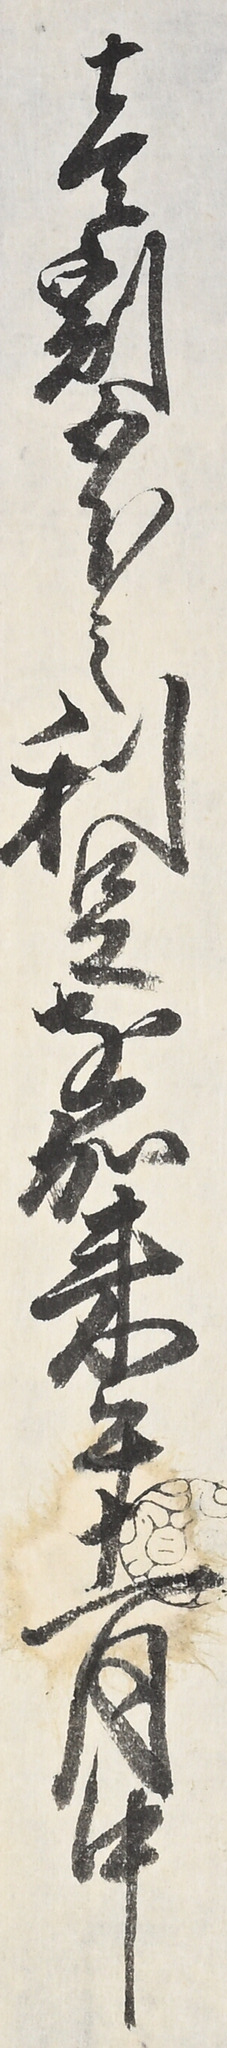壱割五分之利足を加、来午㊞十一月中
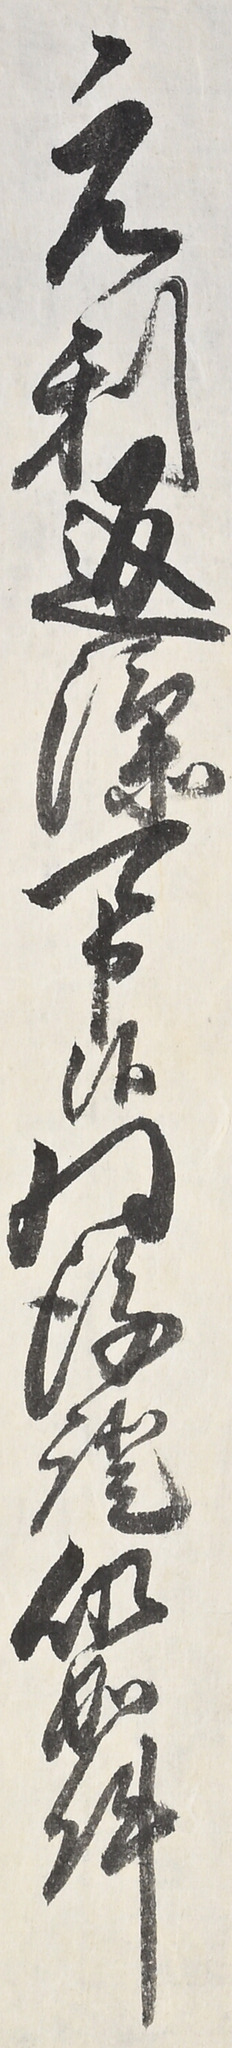元利返済可申候、為後証仍如件
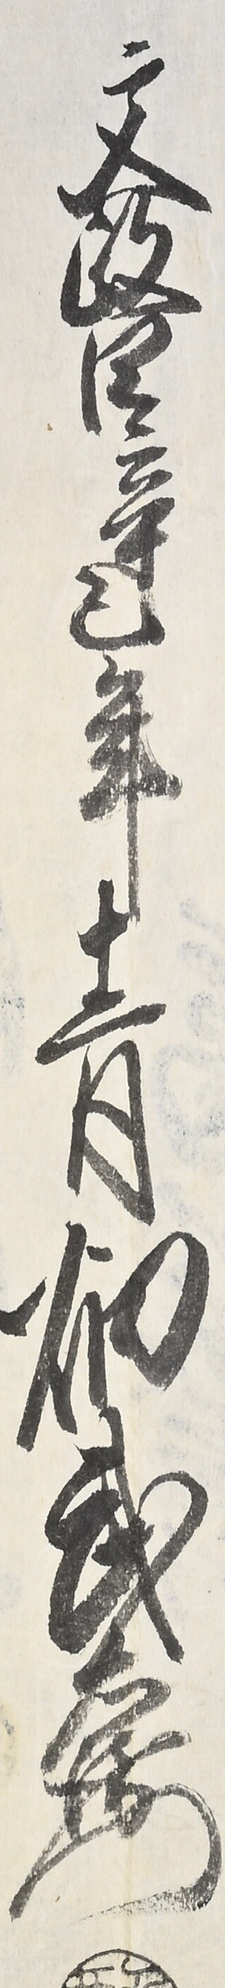文政四辛巳年十二月畑武右衛門㊞
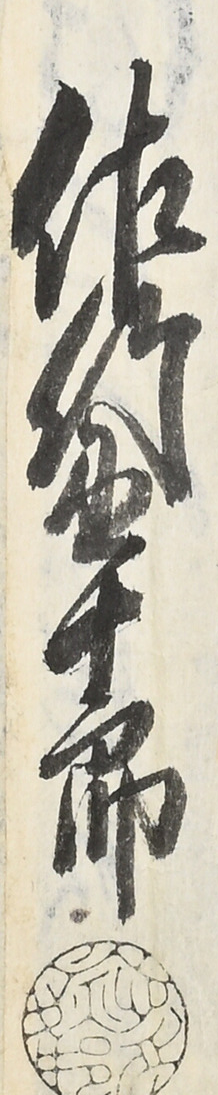佐竹丑十郎㊞
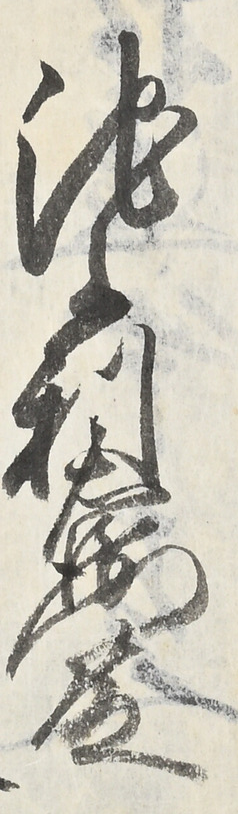池上利右衛門殿
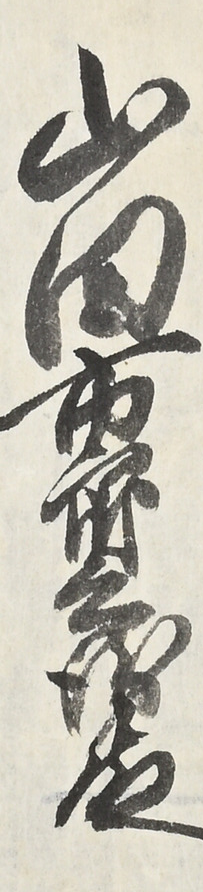山田市郎兵衛殿
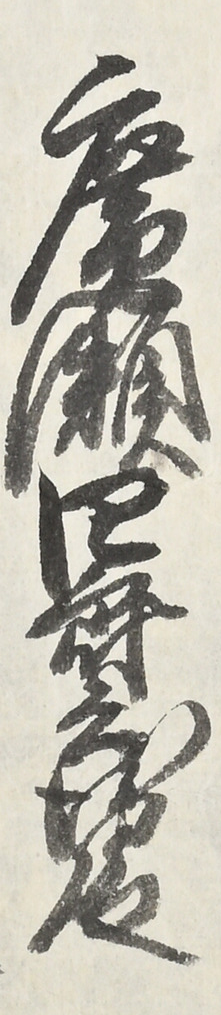広瀬四郎兵衛殿
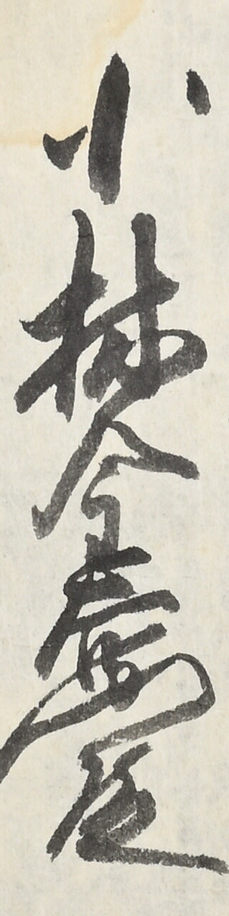小林金右衛門殿
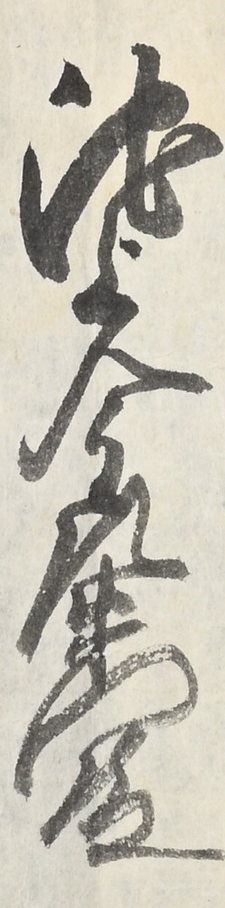池上金左衛門殿

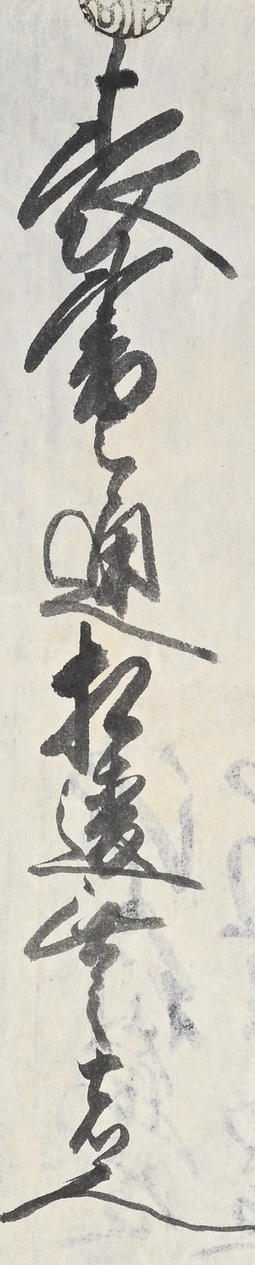表書之通相違無之者也

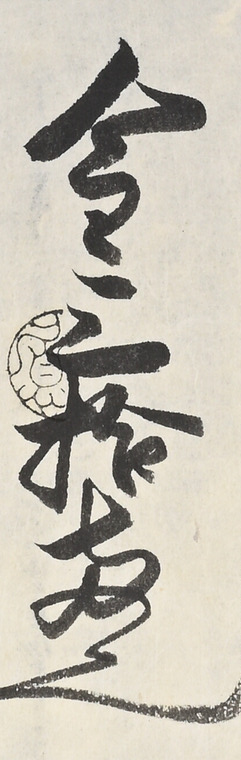金三拾両也
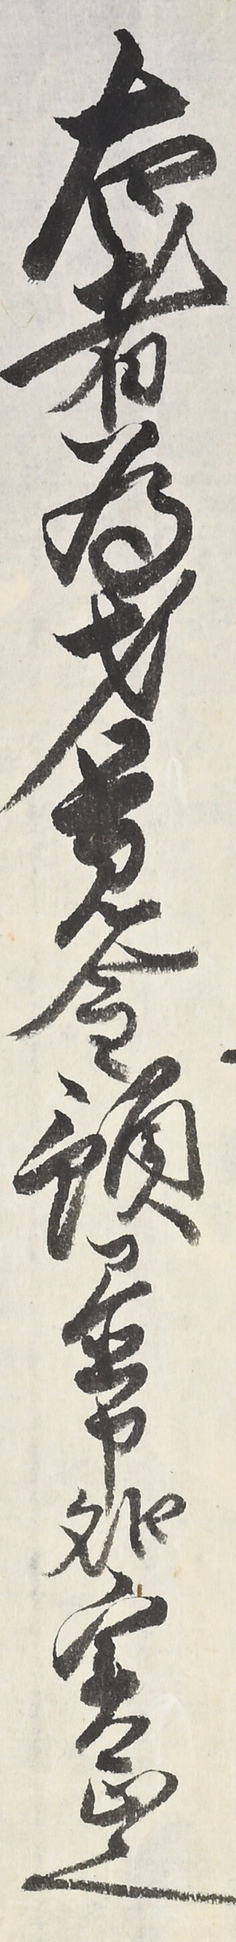右者為才覚金預置申処実正也
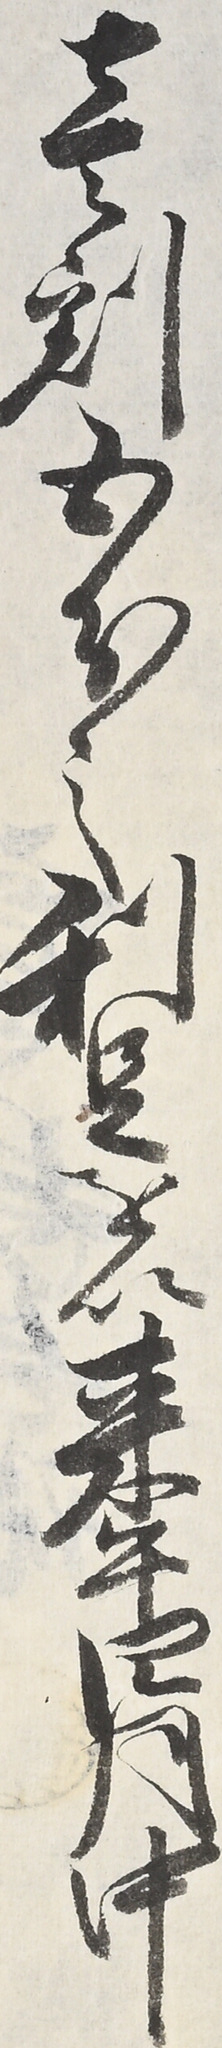壱割五分之利足を以来午四月中
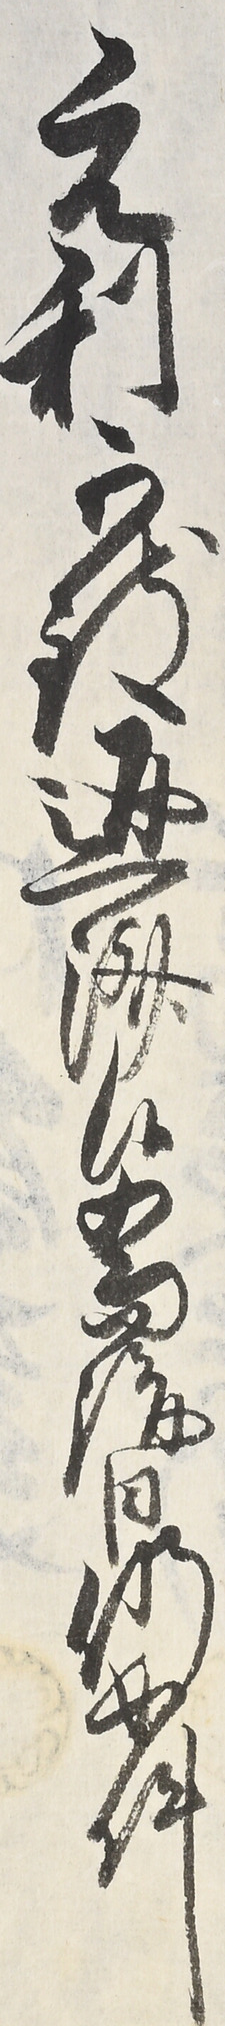元利可致返済候為後日仍如件
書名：覚
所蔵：伊那市立高遠町図書館・合同会社AMANE
